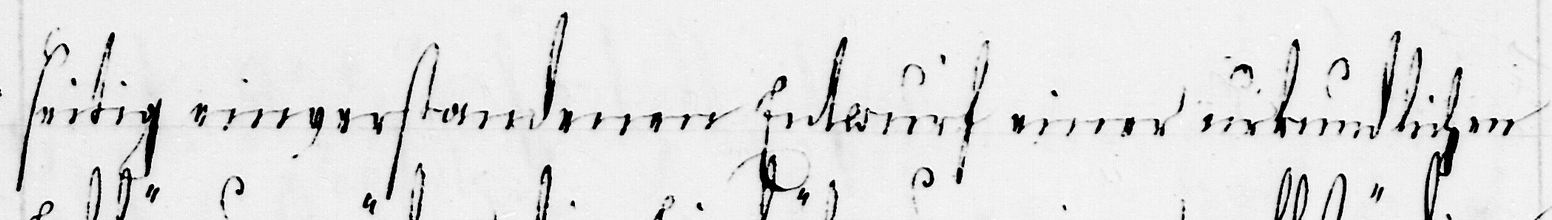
seitig einverstandenen Entwurf einer urkundlichen
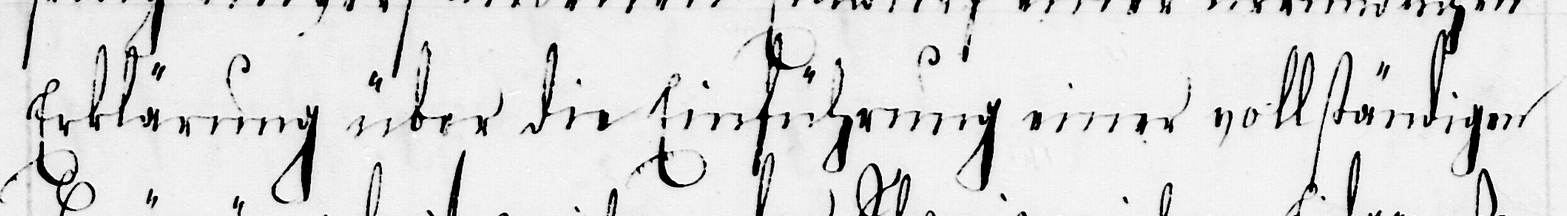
Erklärung über die Einführung einer vollständigen
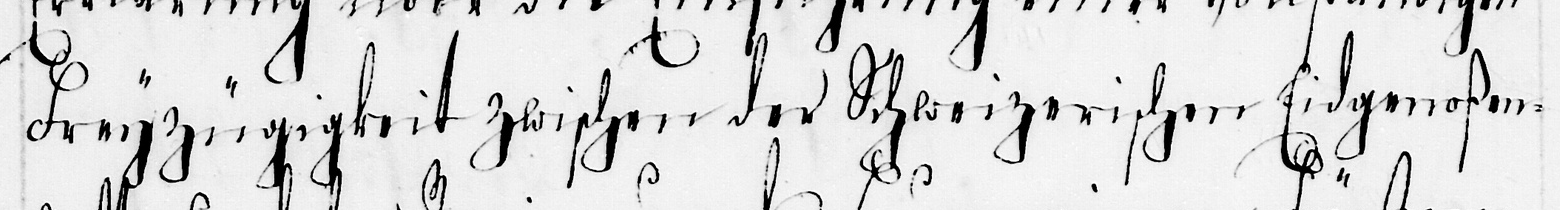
Freyzügigkeit zwischen der Schweizerischen Eidgenoßen¬
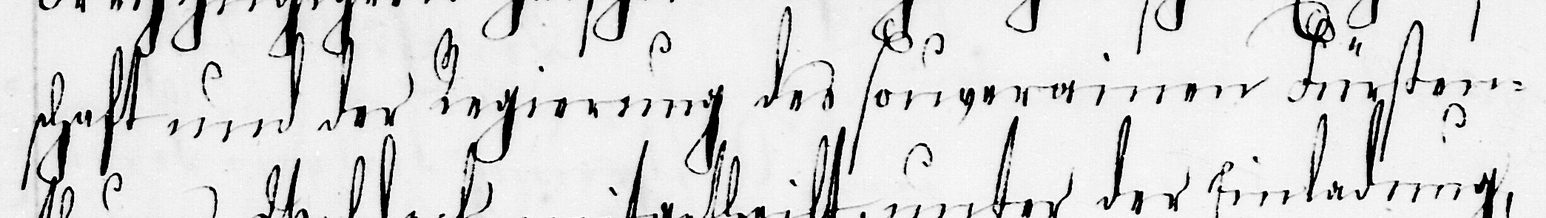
schaft und der Regierung des souverainen Fürsten¬
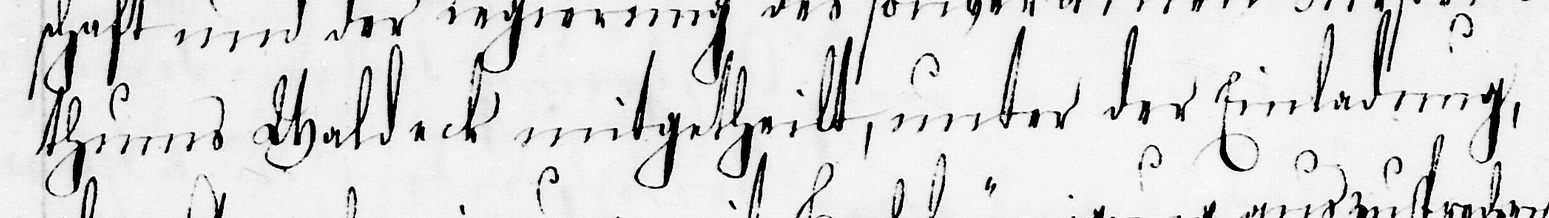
thums Waldeck mitgetheilt, unter der Einladung,
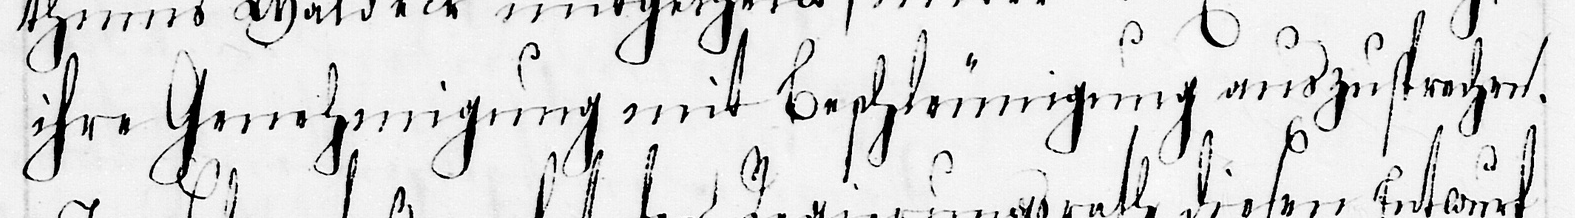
ihre Genehmigung mit Beschleunigung auszusprechen.
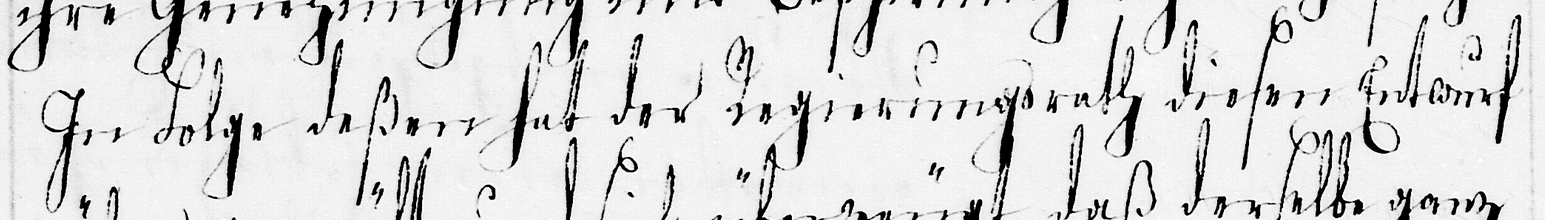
In Folge deßen hat der Regierungsrath diesen Entwurf
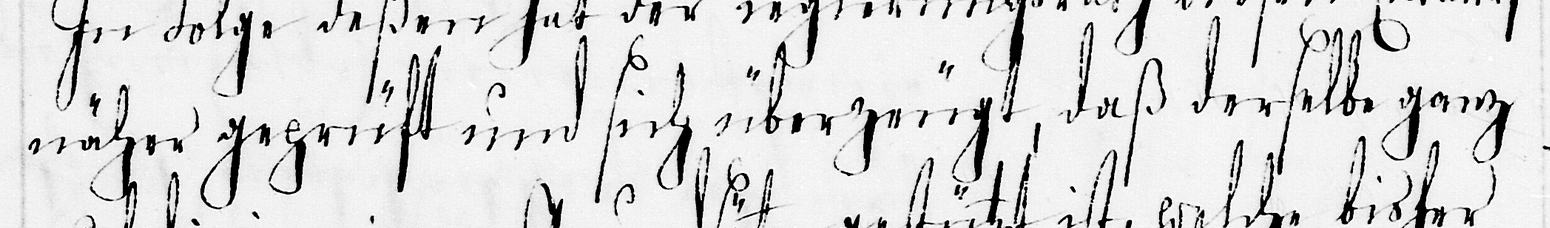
näher geprüft und sich überzeugt, daß derselbe ganz
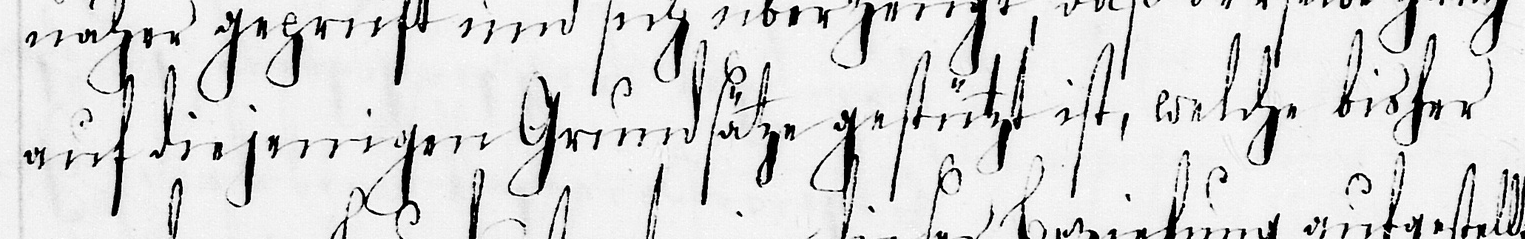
auf diejenigen Grundsätze gestützt ist, welche
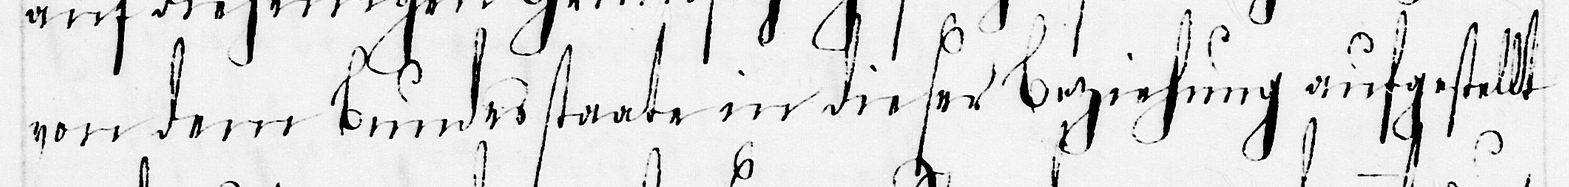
von dem Bundesstaate in dieser Beziehung aufgestellt
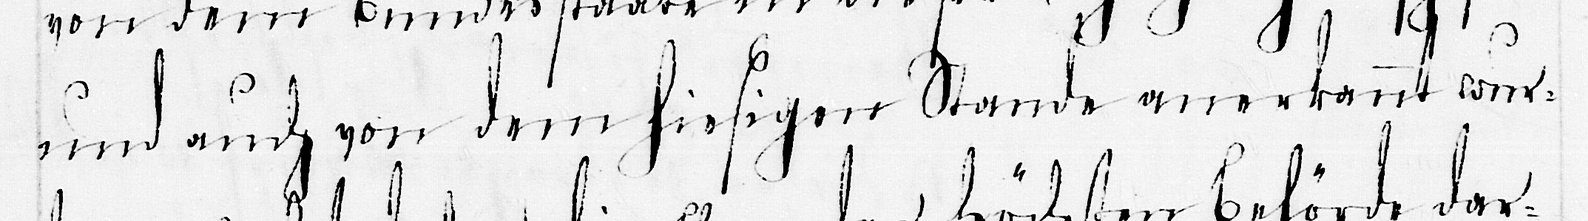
und auch von dem hiesigen Stande anerkannt wur¬
